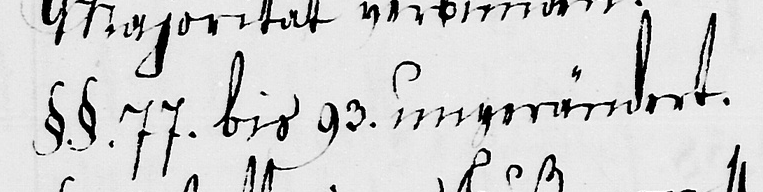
§§. 77. bis 93. unverändert.
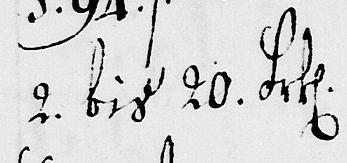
2. bis 20 Fr¬
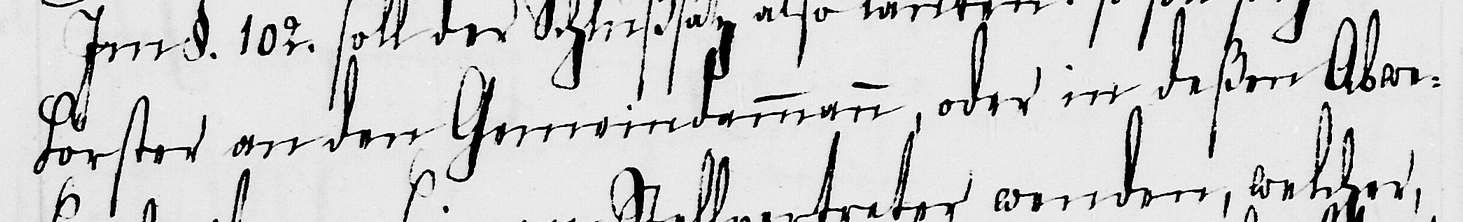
Förster an den Gemeindammann, oder in deßen Abwe¬
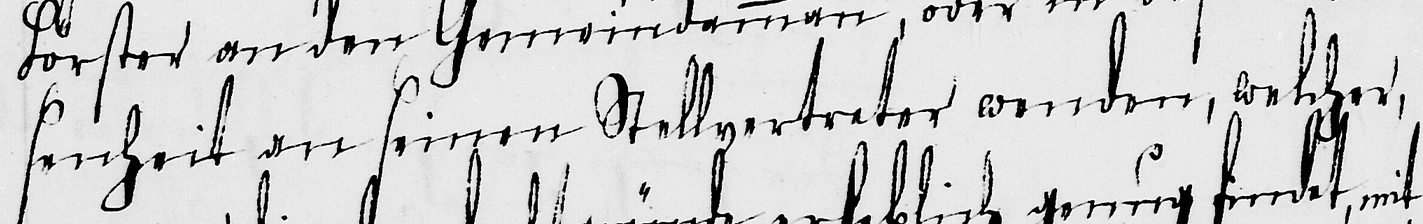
senheit an seinen Stellvertreter wenden, welcher,
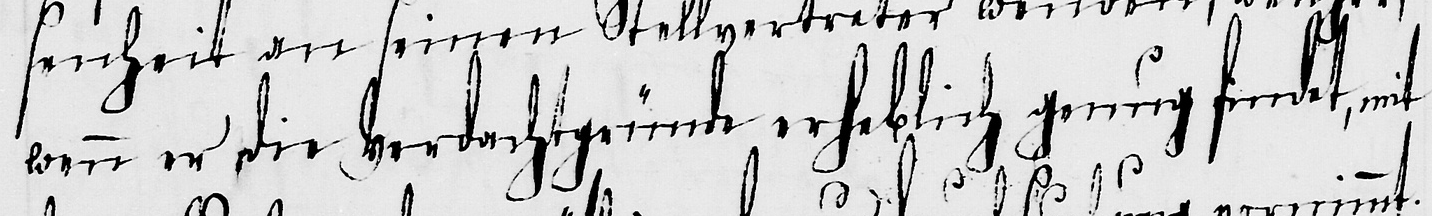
wenn er die Verdachtgründe erheblich genug findet,
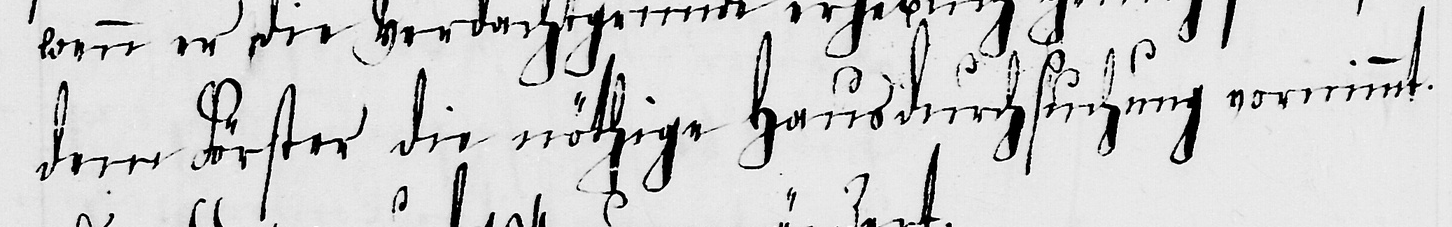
dem Förster die nöthige Hausdurchsuchung vornimm¬
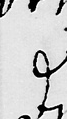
t.
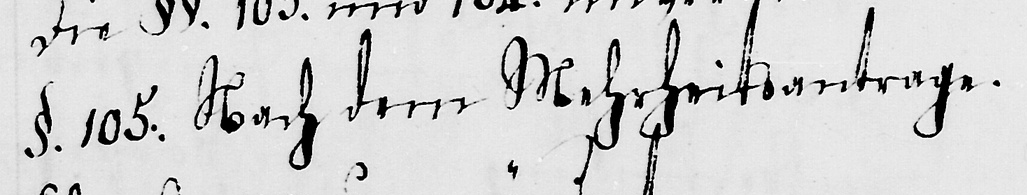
§. 105. Nach dem Mehrheitsantrage.
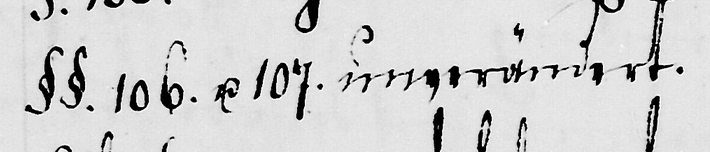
§§. 106. & 107. unverändert.
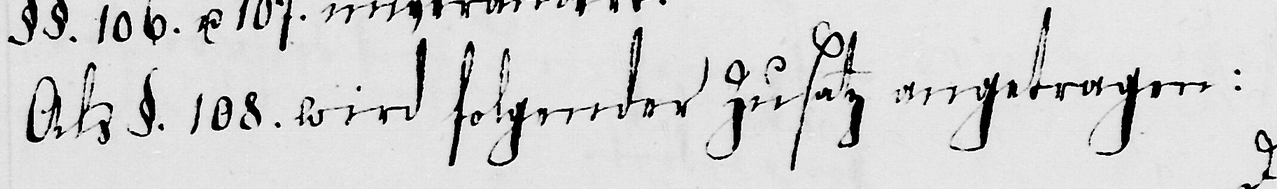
Als §. 108. wird folgender Zusatz angetragen:
